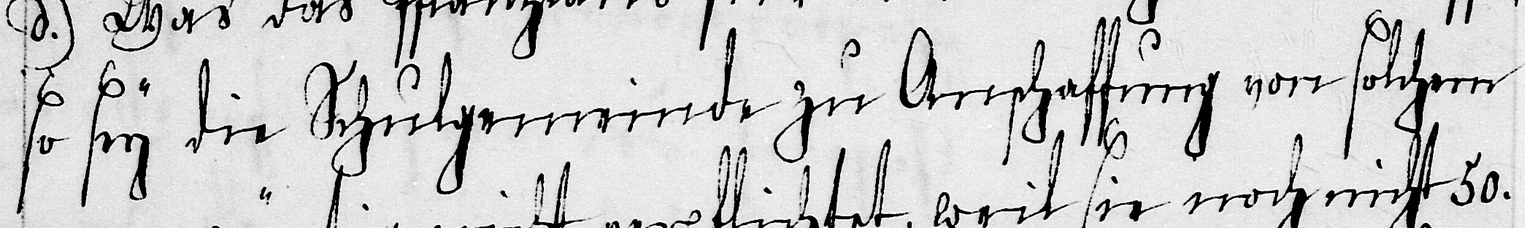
so sey die Schulgemeinde zu Anschaffung von solchem
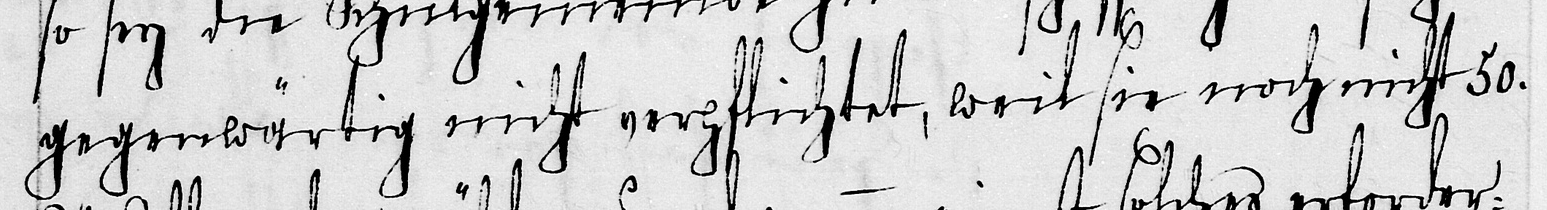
gegenwärtig nicht verpflichtet, weil sie noch nicht 50.
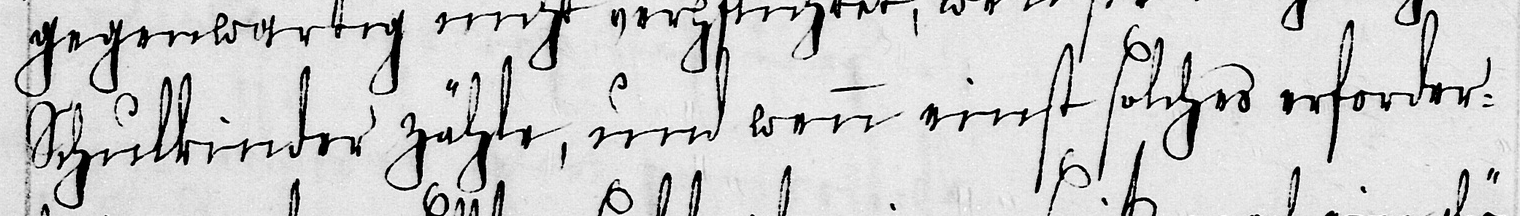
Schulkinder zähle, und wenn einst solches erforder¬
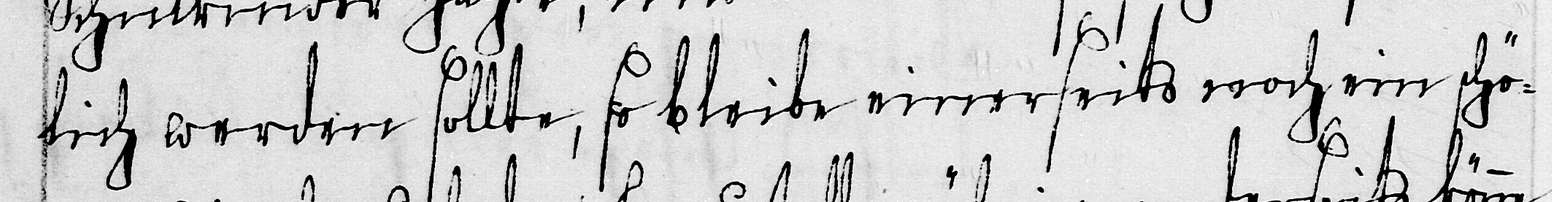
lich werden sollte, so bleibe einerseits noch ein schö¬
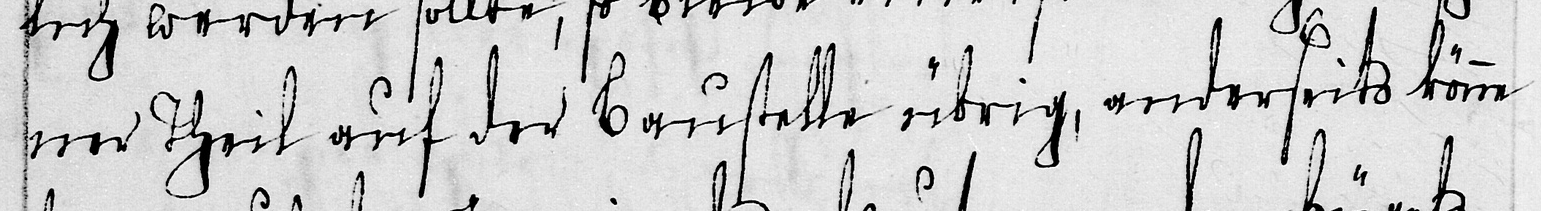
ner Theil auf der Baustelle übrig, anderseits könne
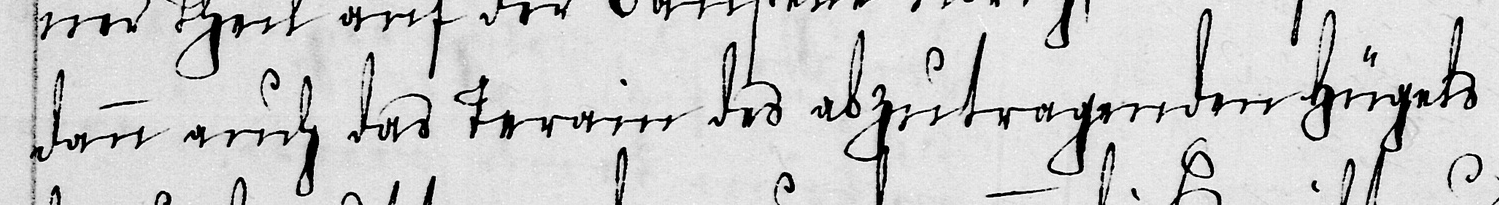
dann auch das Terain des abzutragenden Hügels
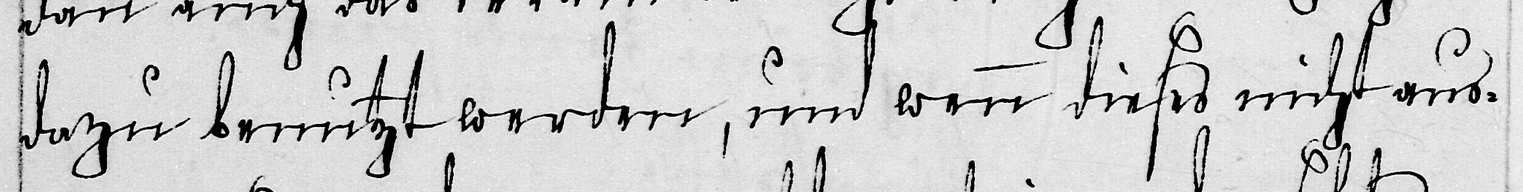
dazu benutzt werden, und wenn dieses nicht aus¬
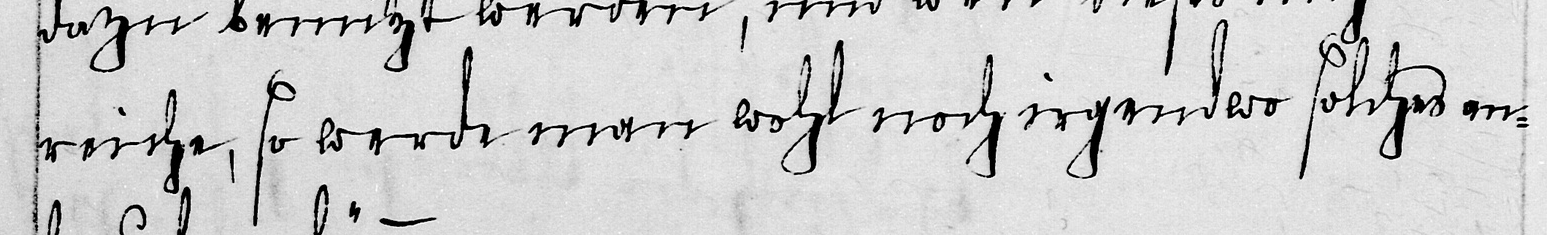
reiche, so werde man wohl noch irgendwo solches an¬
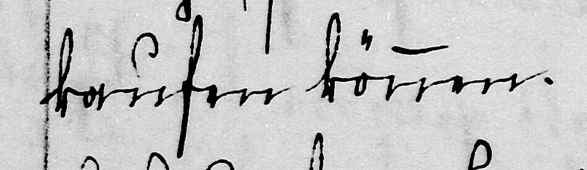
kaufen können.
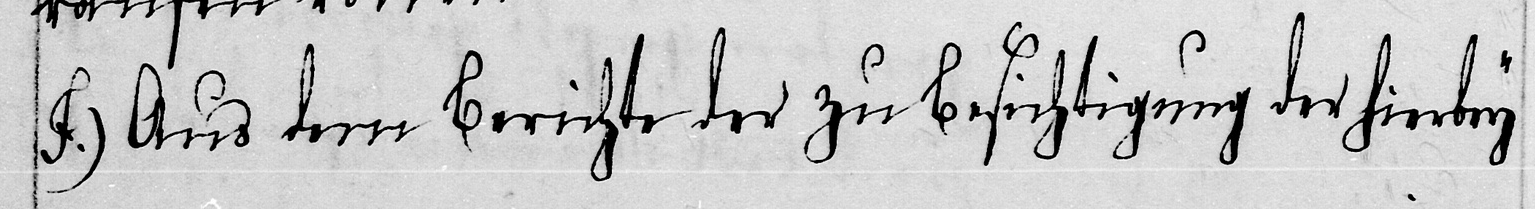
F.) Aus dem Berichte der zu Besichtigung der hierbey
